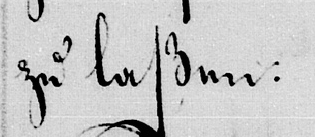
zu laßen.
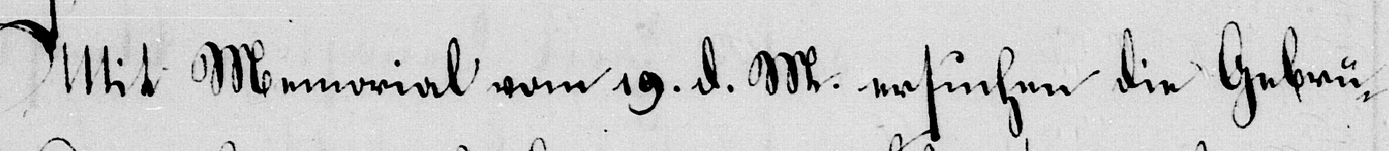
Mit Memorial vom 19. d. M. ersuchen die Gebrü¬
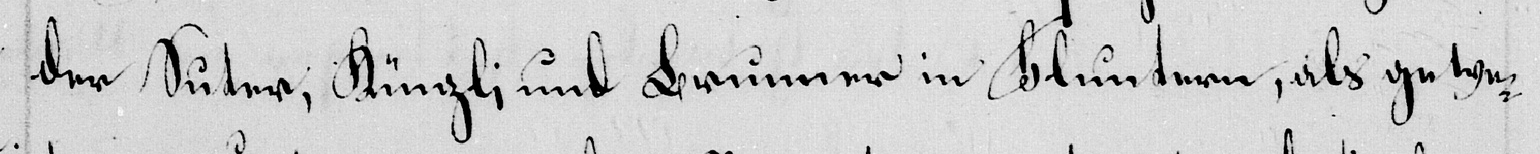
der Suter, Künzli und Brunner in Fluntern, als gewe¬
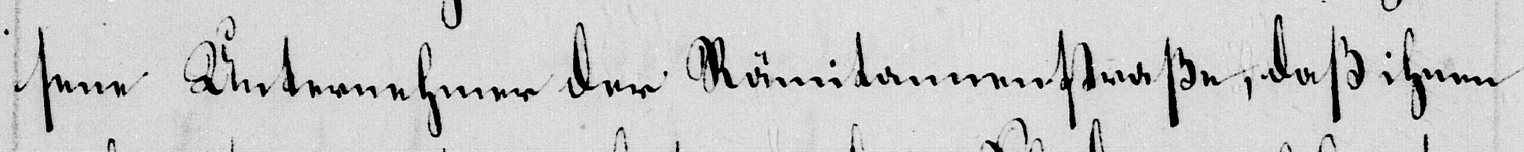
sene Unternehmer der Rämitannenstraße, daß ihnen
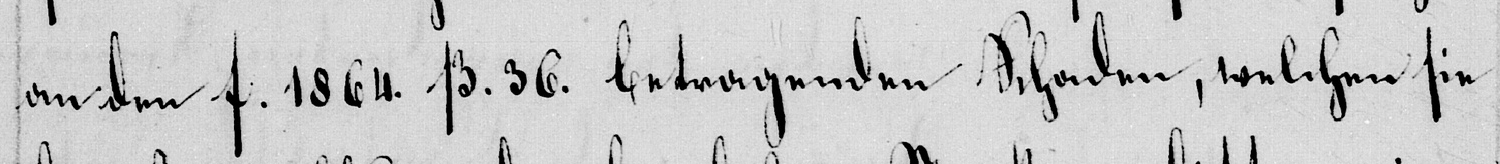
an den f. 1864. ß. 36. betragenden Schaden, welchen sie
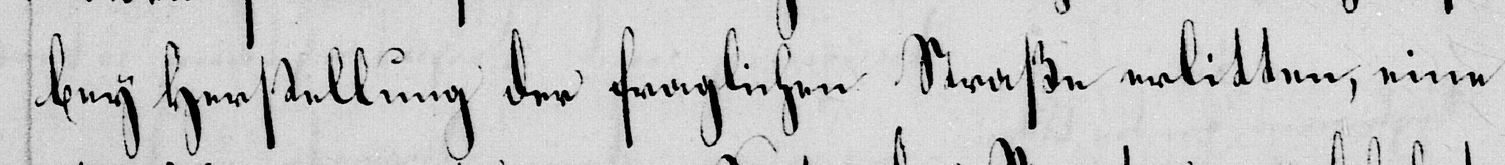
bey Herstellung der fraglichen Straße erlitten, eine
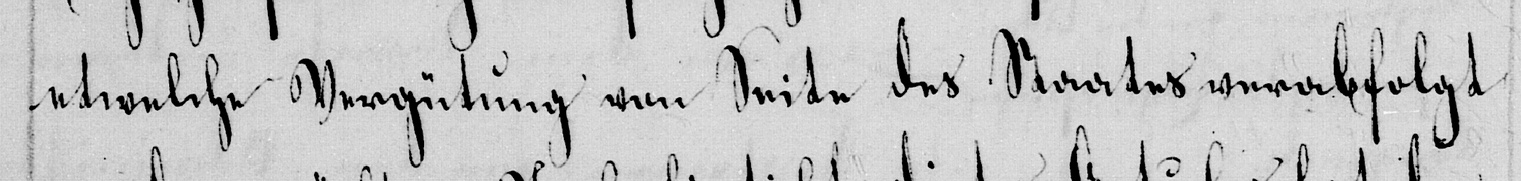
etwelche Vergütung von Seite des Staates verabfolgt
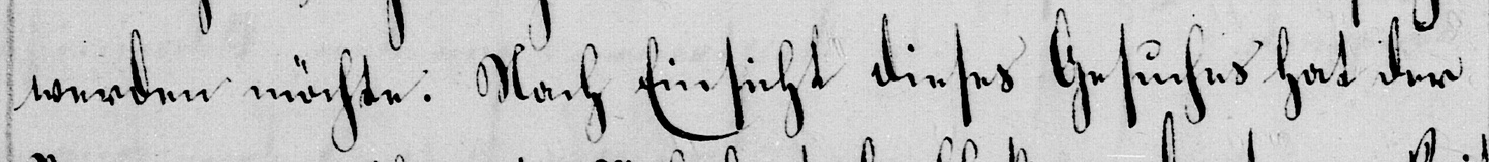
werden möchte. Nach Einsicht dieses Gesuches hat der
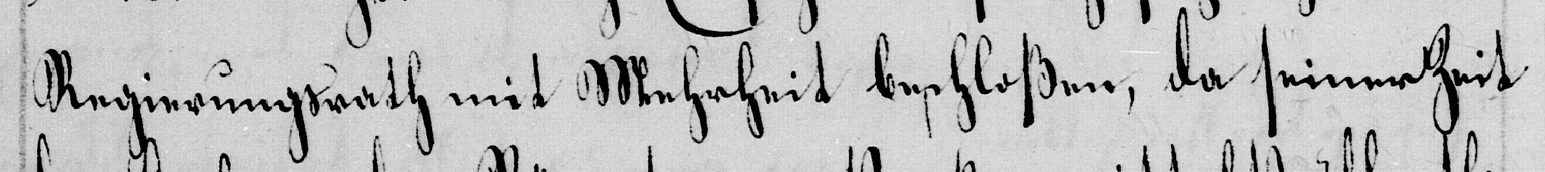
Regierungsrath mit Mehrheit beschloßen, da seiner Zeit
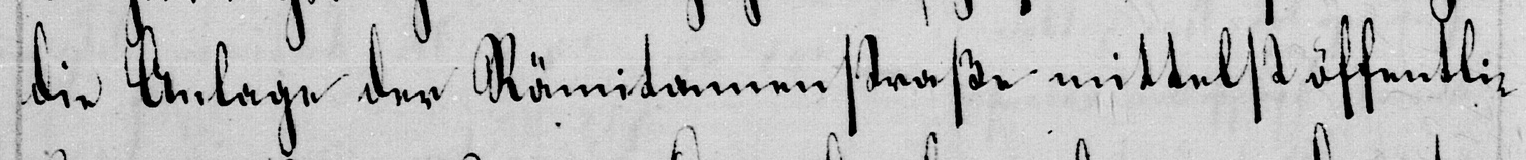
die Anlage der Rämitannenstraße mittelst öffentli¬
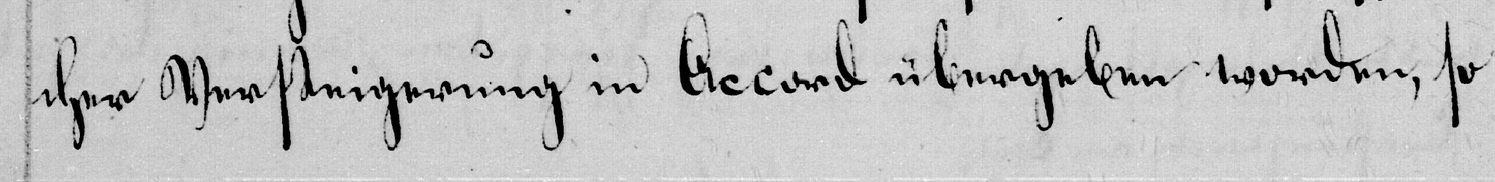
che Versteigerung in Accord übergeben worden, so
